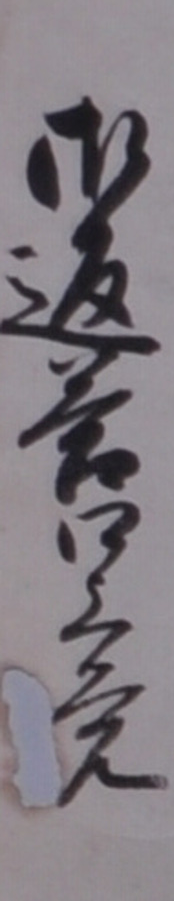御返答口上覚
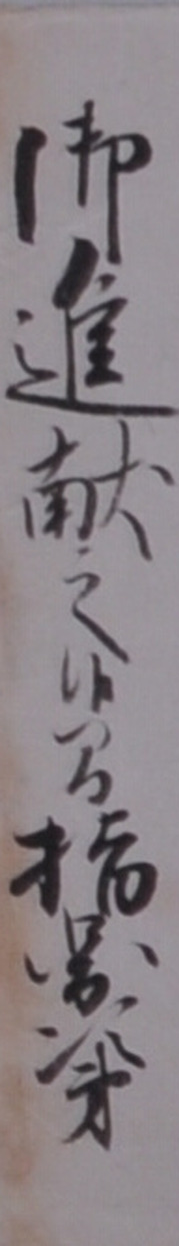御進献之候間指図次第
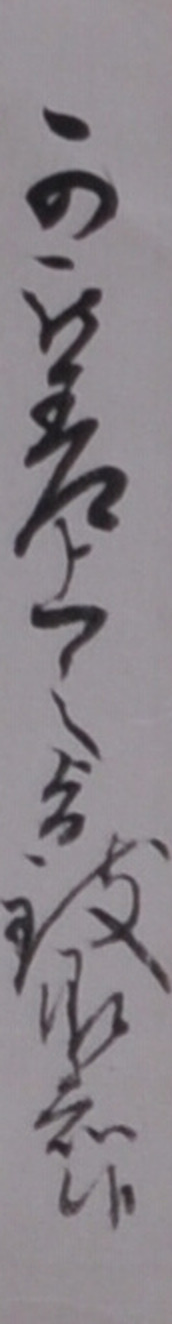可被差上之旨致承知候
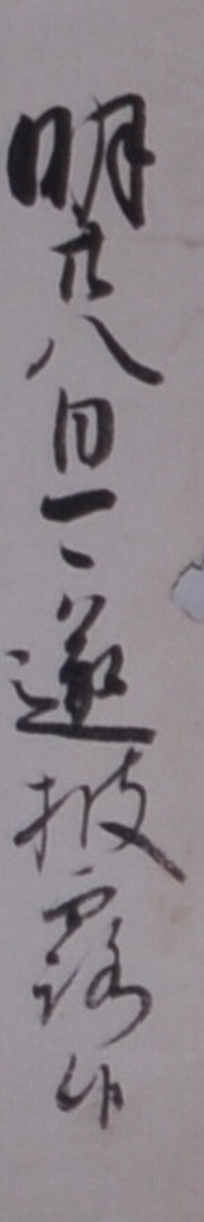明廿八日可遂披露候
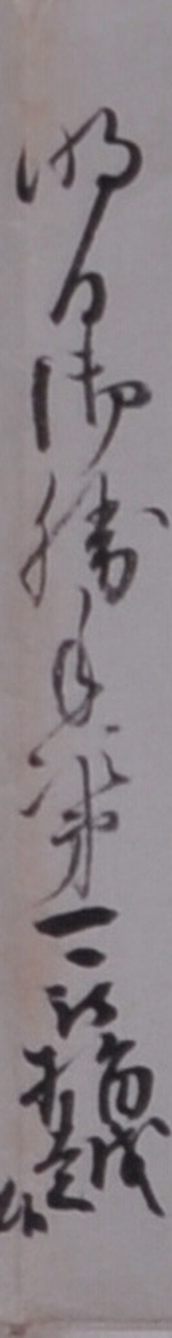明日御勝手次第可被指越候
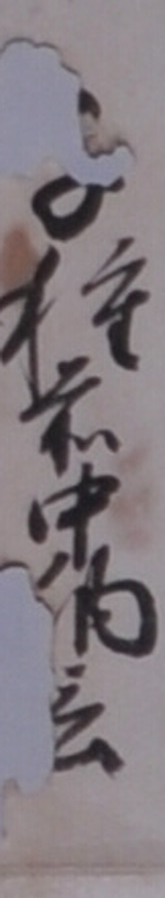千種前中納言
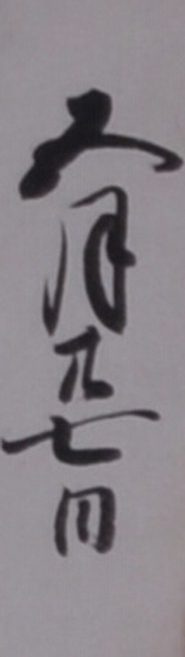五月廿七日
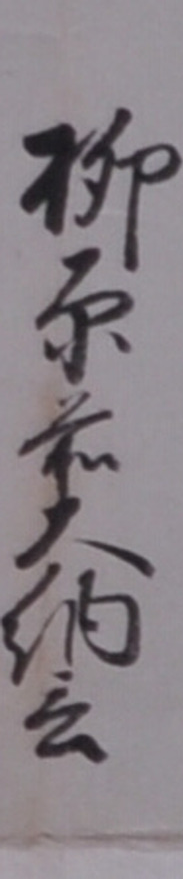柳原前大納言
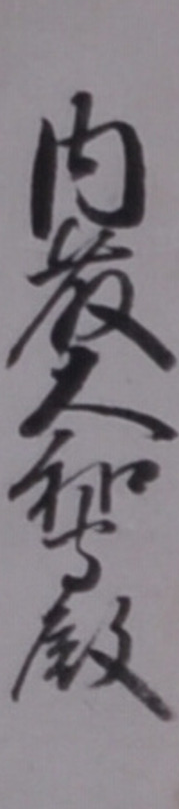内藤大和守殿
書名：御返答口上覚
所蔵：伊那市立高遠町図書館・合同会社AMANE
